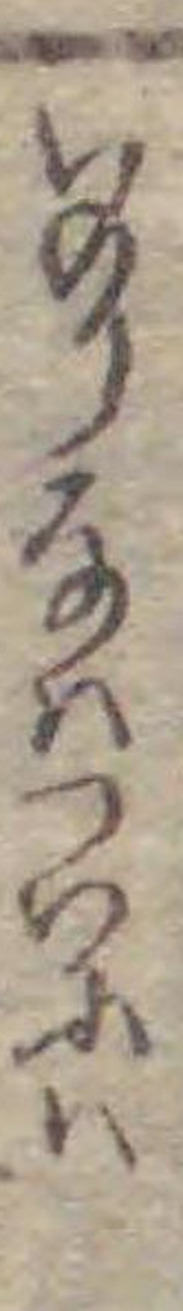いのりなはついには
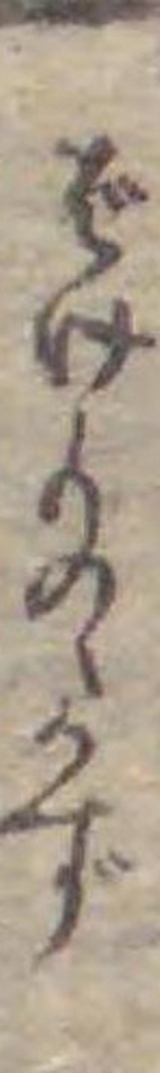ばけものゝかず
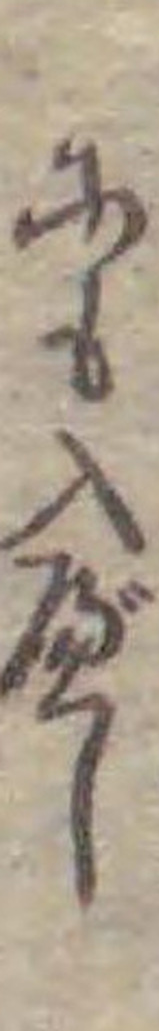にも入べし
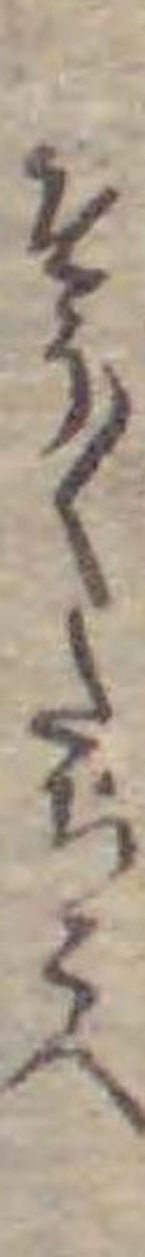そう〳〵たちこへ
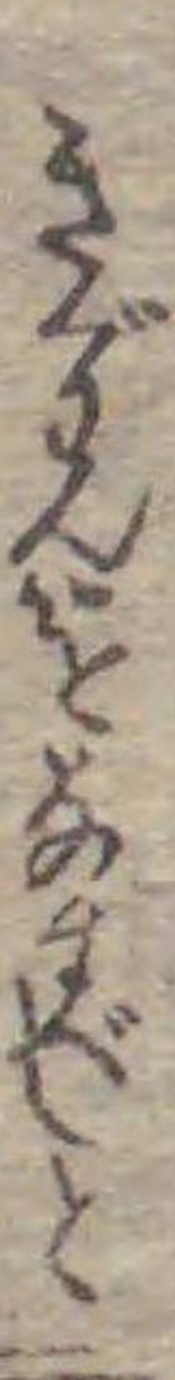きぐわんをなすべしと
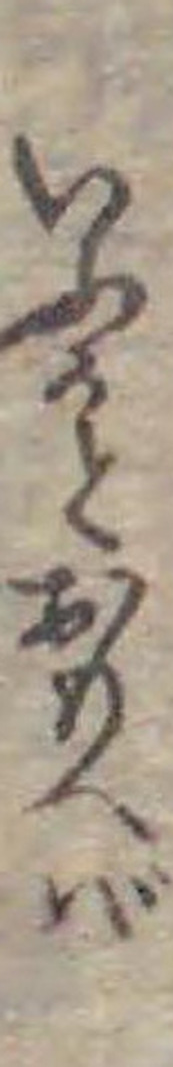いふかとおもへば
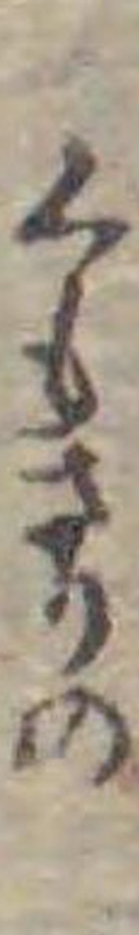くもきりの
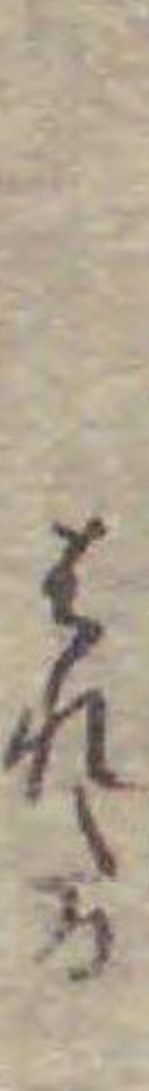はれたる
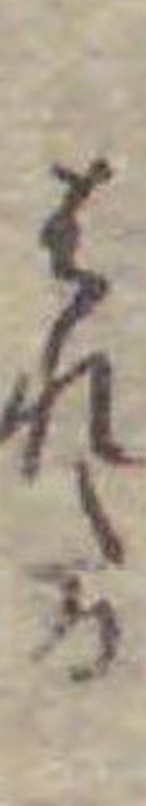はれたる
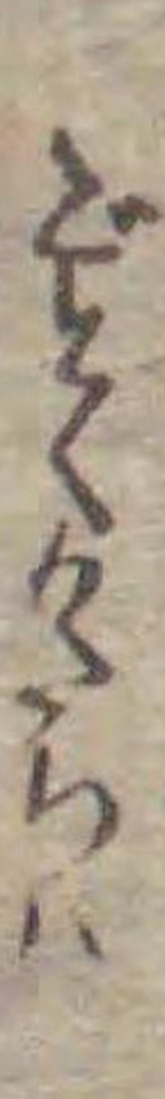ごとくかたちは
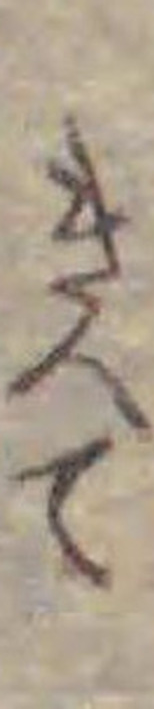きへて
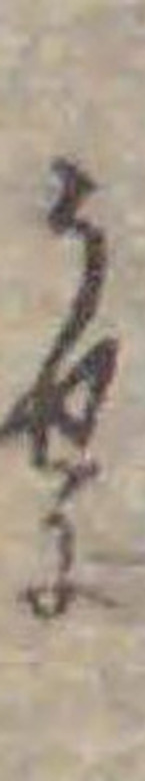うせに

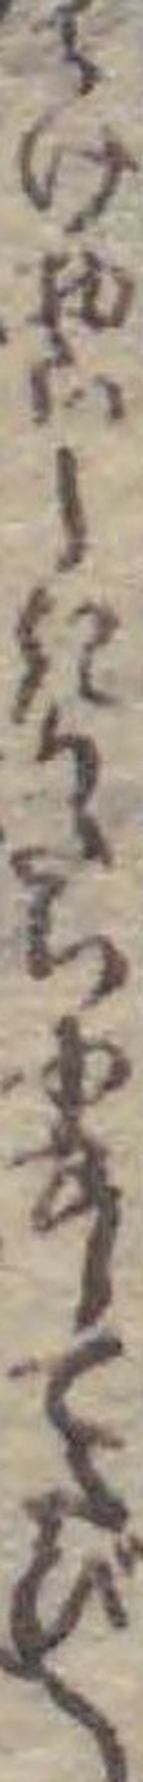はけ物らしきかたちになしてたび
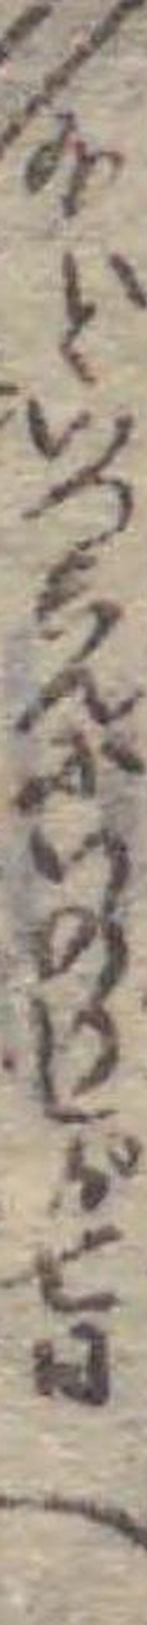給へといつしんにいのりしが七日
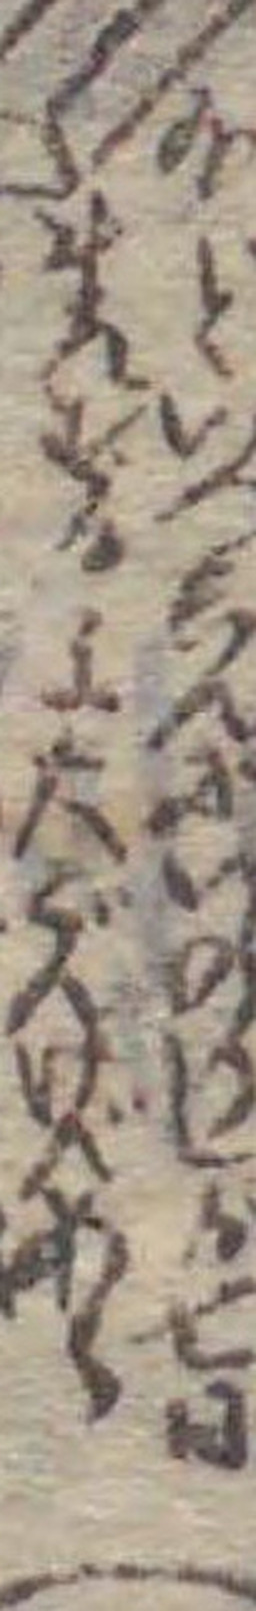まんするに大ごんげんあら
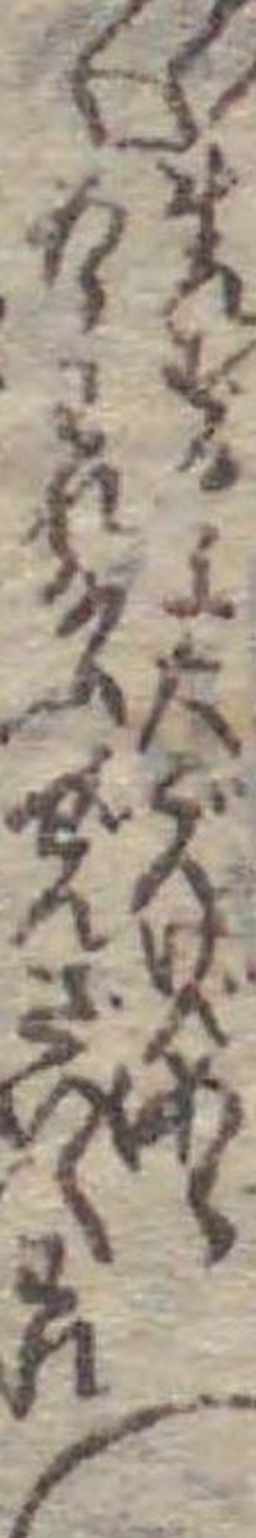あらわれ給ふぜんざい〳〵われ
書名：[化物一代記] : 5巻
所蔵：国立国会図書館 National Diet Library, JAPAN
